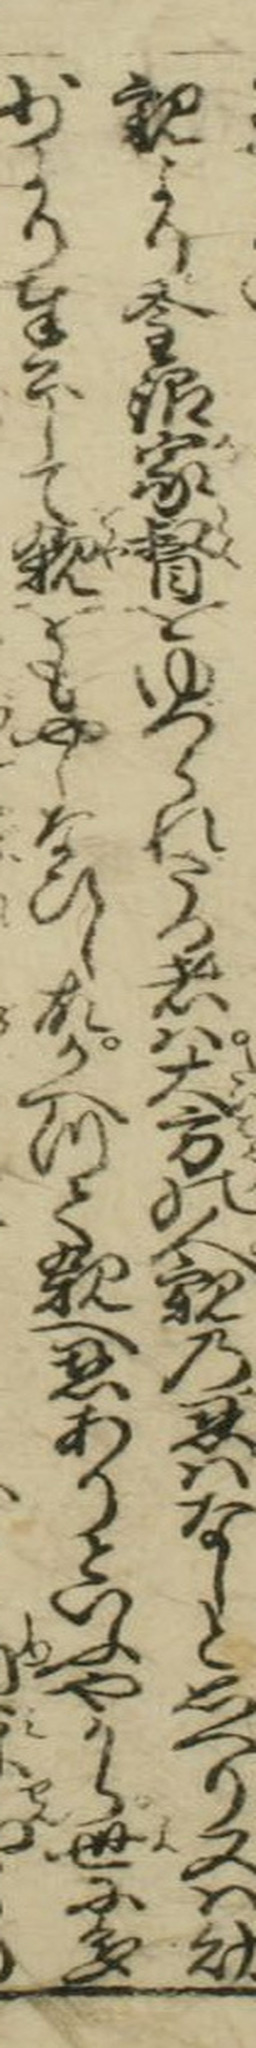少より奉公して親どもやしなひし故。かへつて親へ恩ありといふやから。世に多
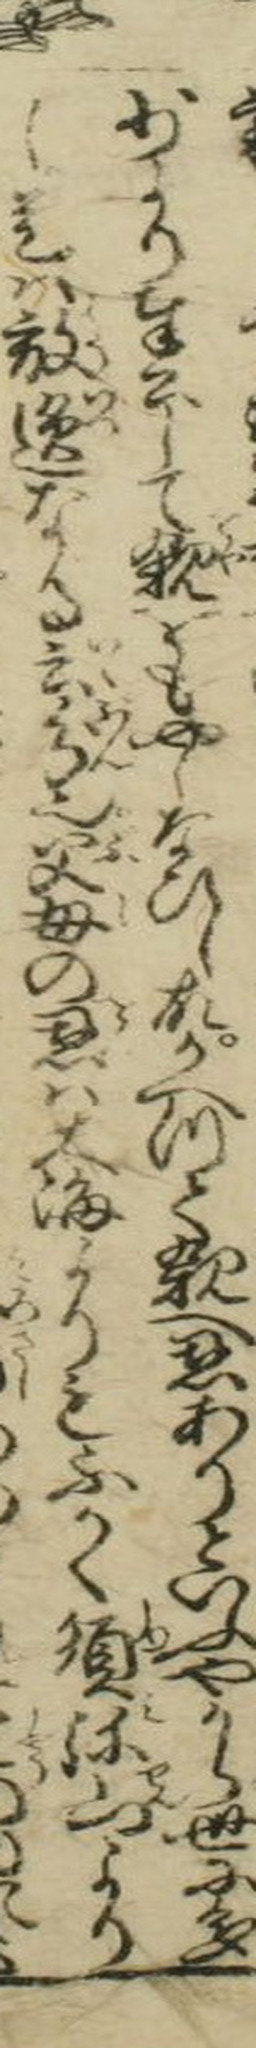し是は放逸なる云分也。父母の恩は大海よりもふかく須弥山より
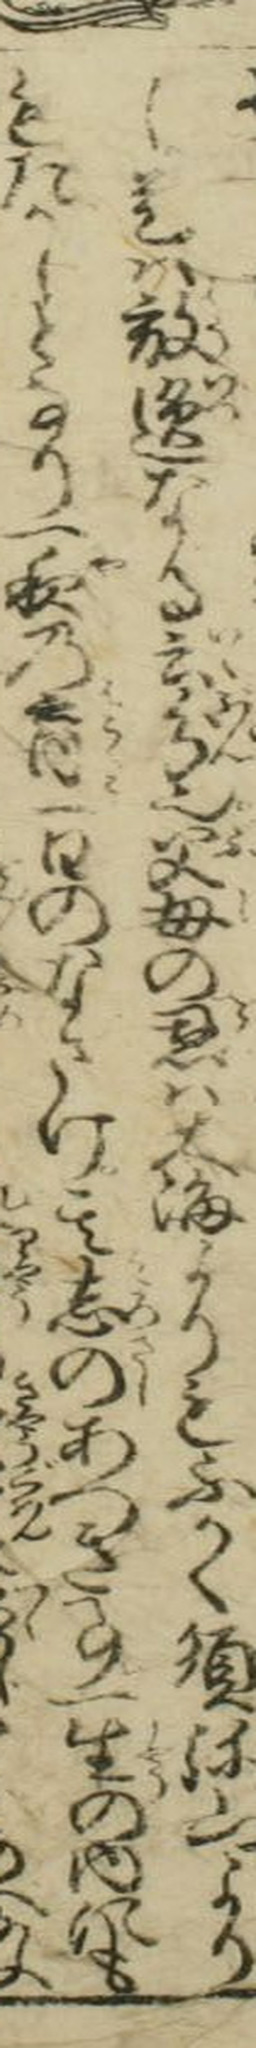もたかしとなり一夜の育一日のなさけ其志のあつき事一生の内にも
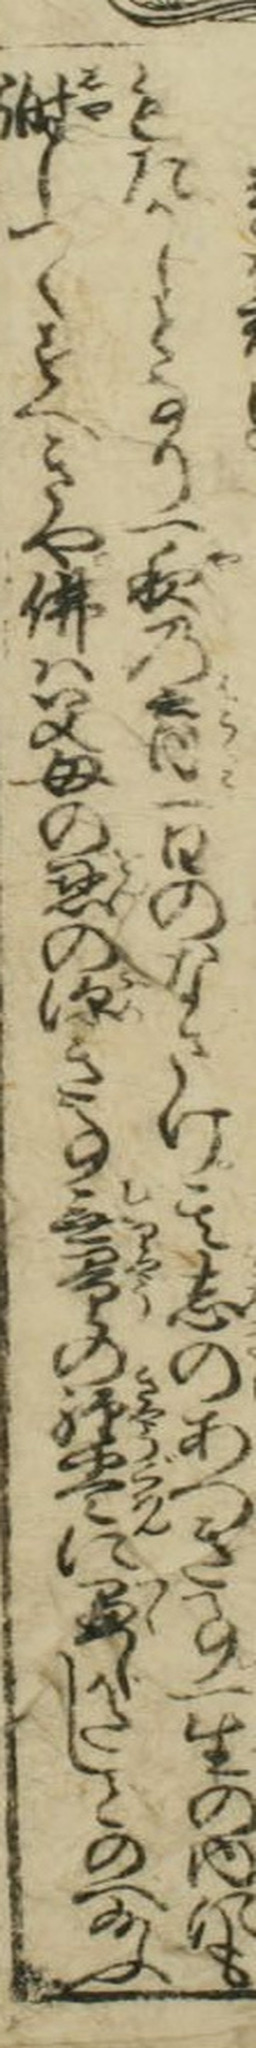謝しつくすへきや佛は父母の恩の深き事無量の経巻に盡しがたしとのへ給ふ
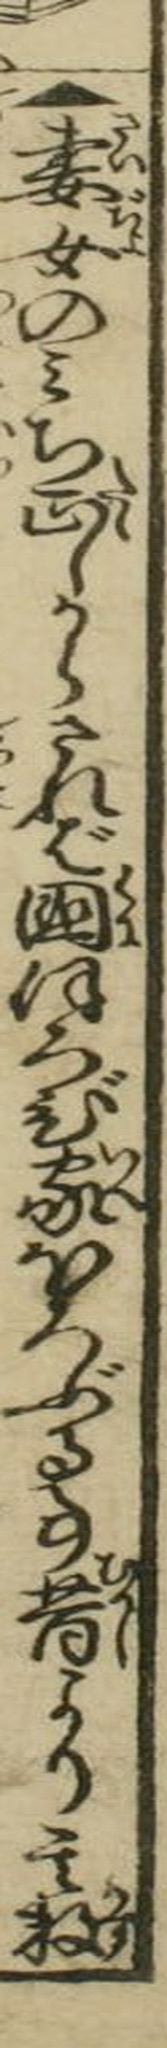▲妻女のみち正しからされば國ほろび家ほろぶる事昔より其数
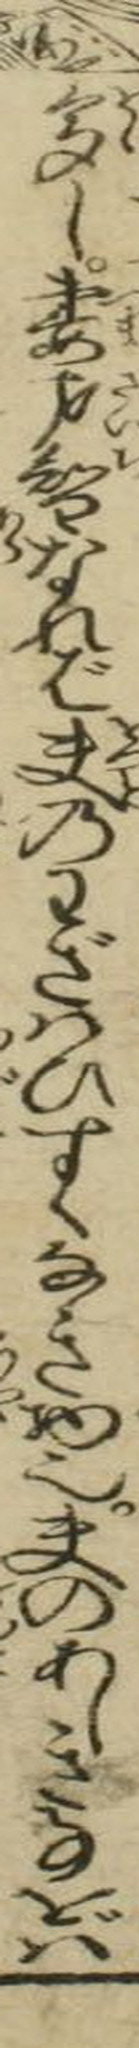多し妻才智なれば夫のわざはひすくなき物也。夫のあしき事をば
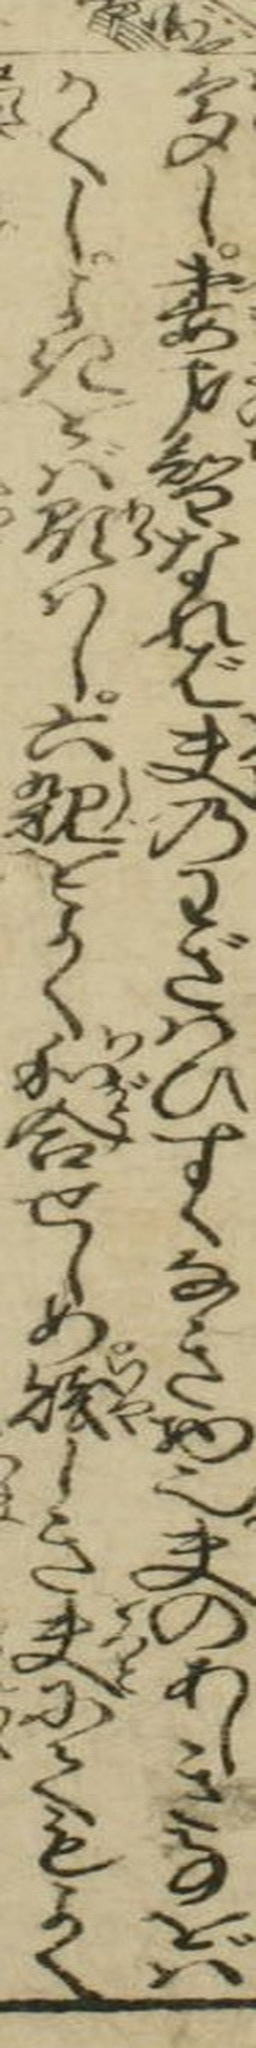かくし。よきをば顕はし。六親をよく和合せしめ賤しき夫にてもよく
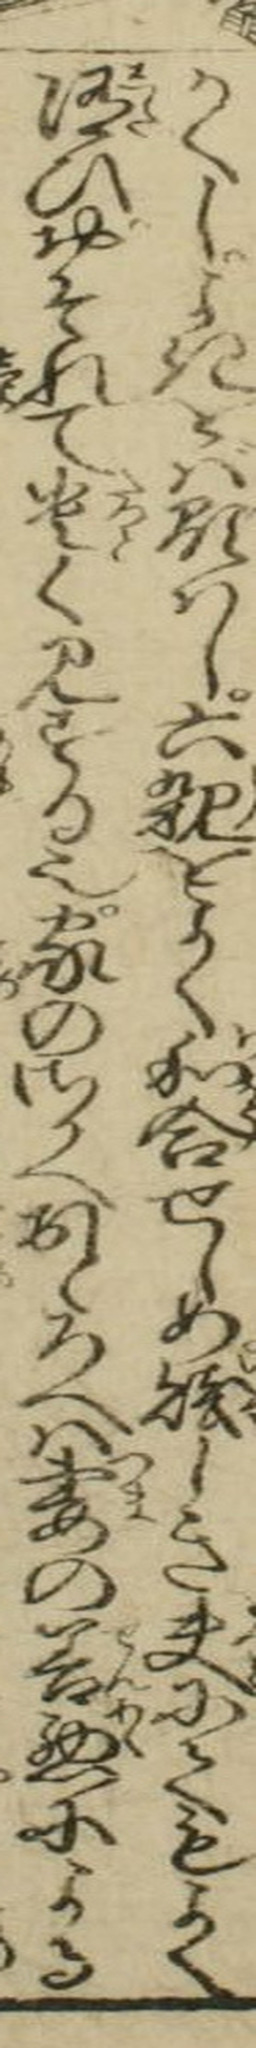侑ひ。おそれて貴く見する也。家のさかへおとろへは妻の善悪による
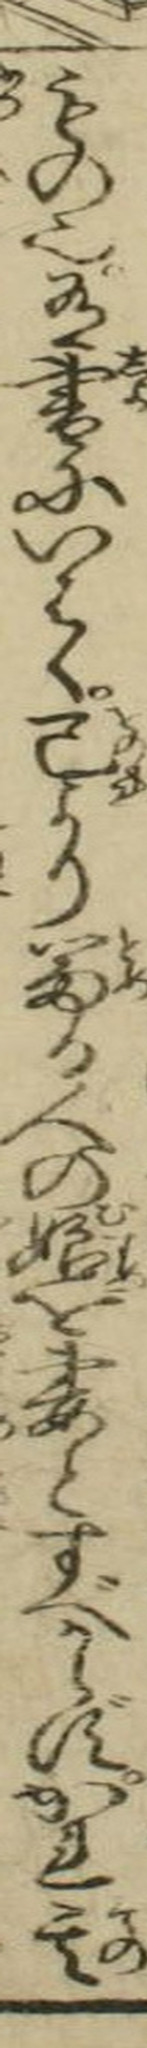もの也。有書にいはく。己より富る人の娘を妻とすべからず。かれ其
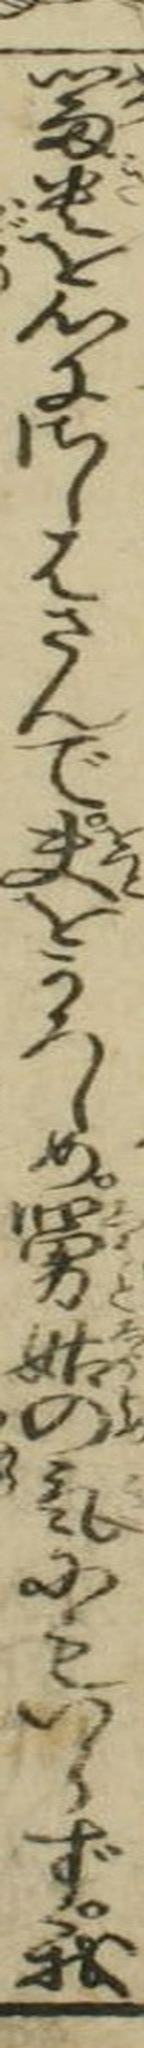富貴を心にさしはさんで。夫をかろしめ。舅姑の気にもいらず。我
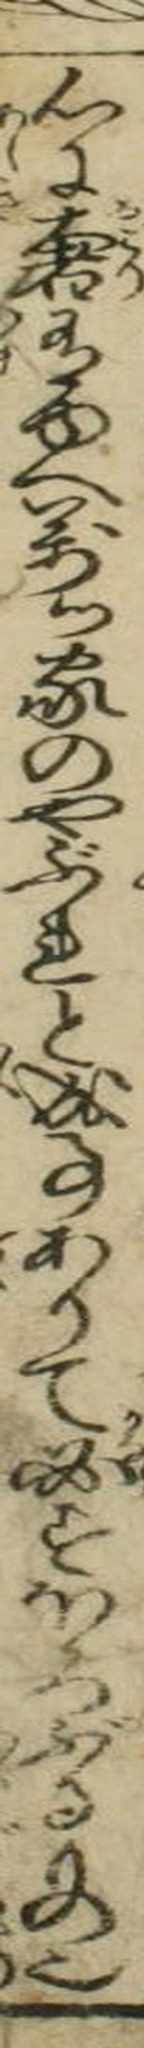心に奢有ゆへ萬つ家のやぶれと成事ありて必すほろぶるもの也
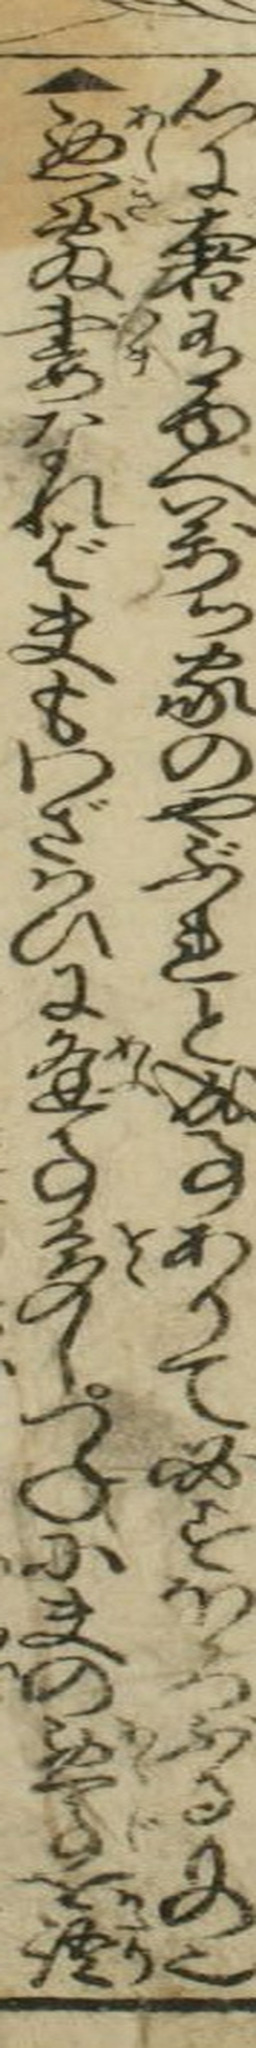▲悪敷妻なれば夫もわざはひに逢事多し。つねに夫の悪事を語
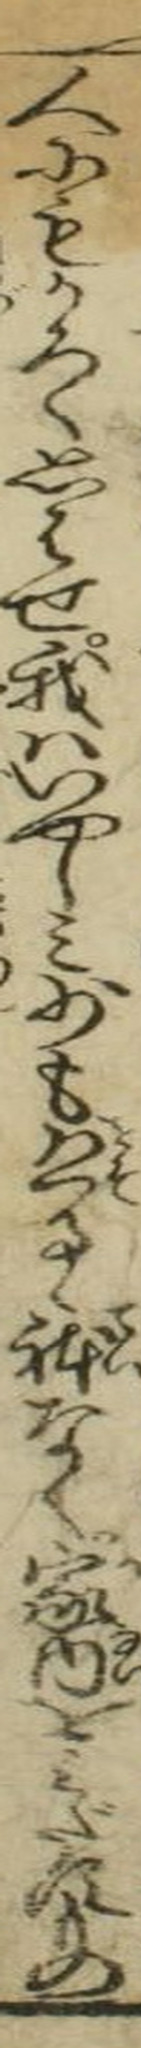人にもかろく思はせ。我はいやしみ少しも恐るゝ体なく。家内をみだすもの
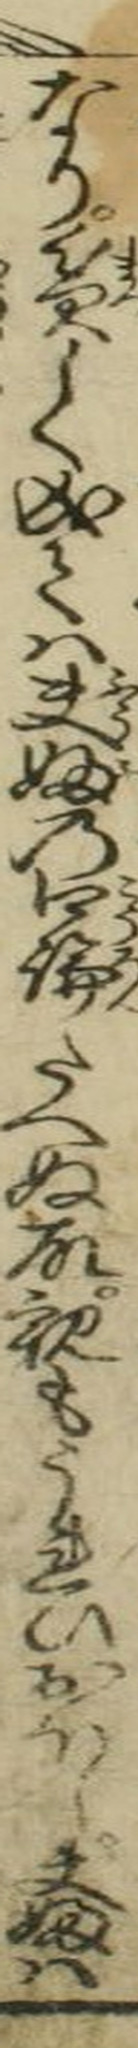なり。貧しく成ては夫婦の口論たへぬ故。親もうれひおほし。夫婦は
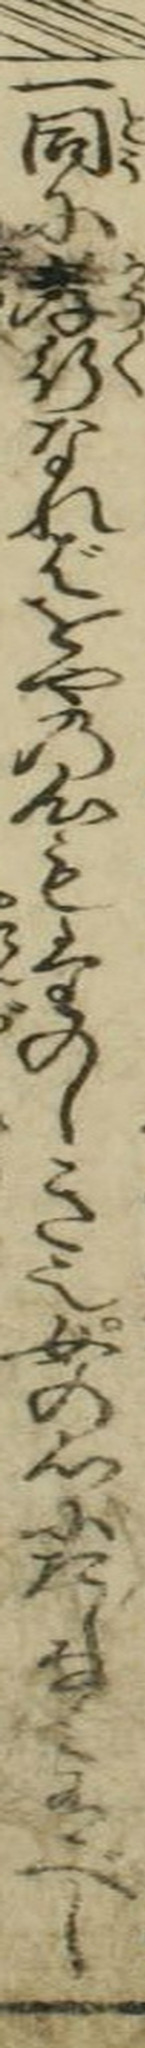一同に孝行なればをやの心もたのしき也。女の心にたしなみ有べし
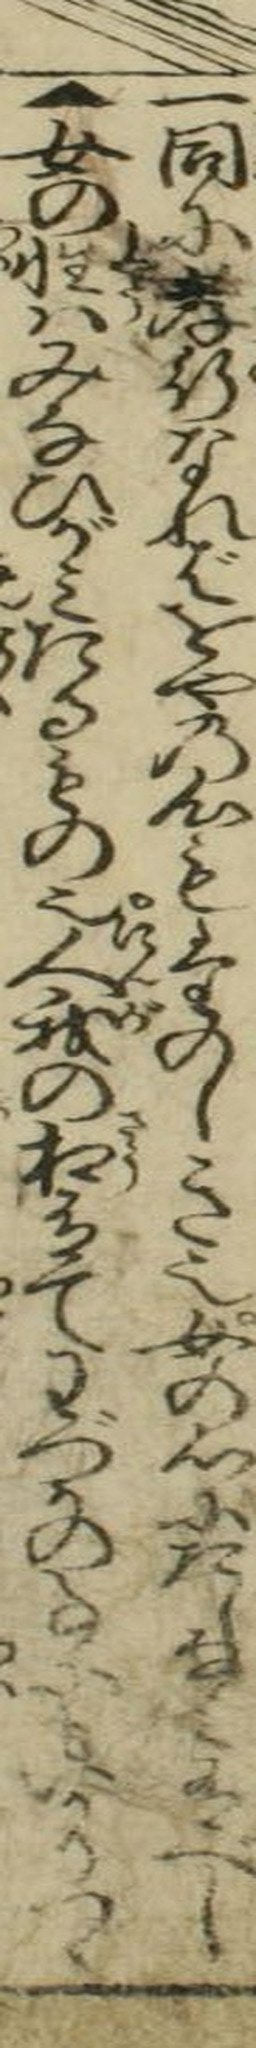▲女の性はみなひがみたるもの也。人我の相有てわづかの事にもいかりて
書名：女源氏教訓鑑
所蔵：東京学芸大学附属図書館
